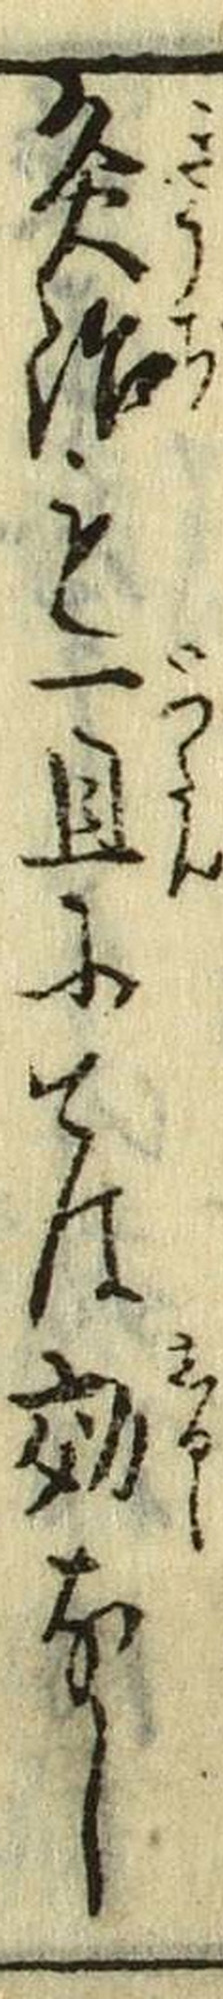灸治も一旦にては効なし
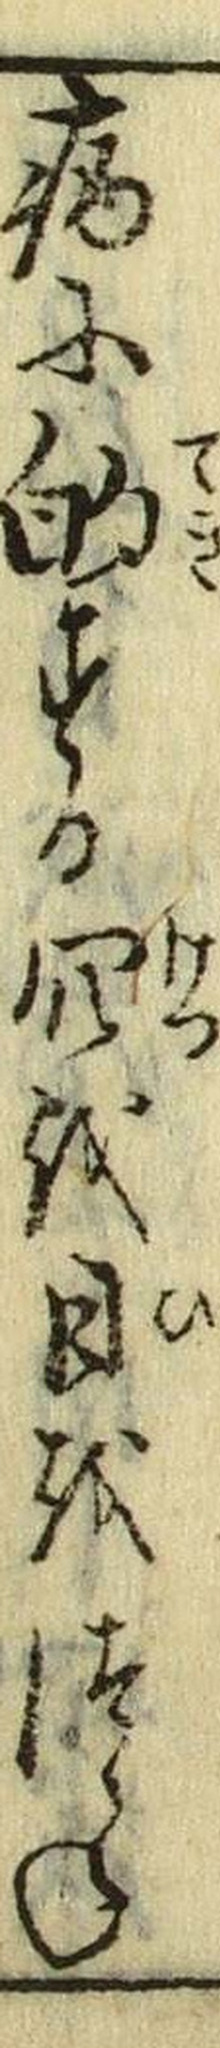病に的する穴を日をつらね

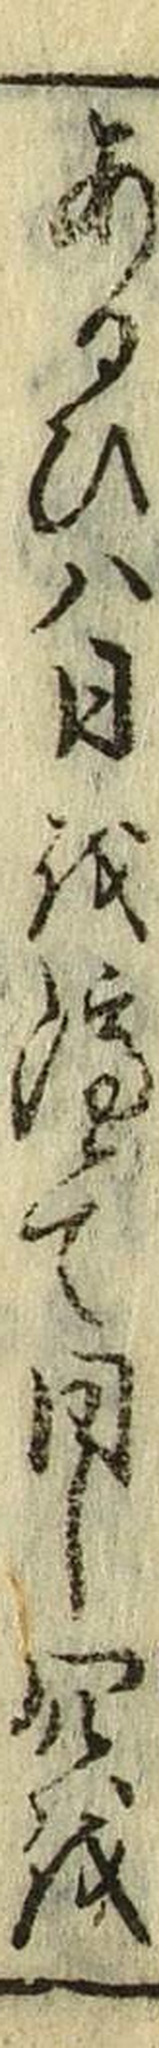あるひは日を隔て同し穴を
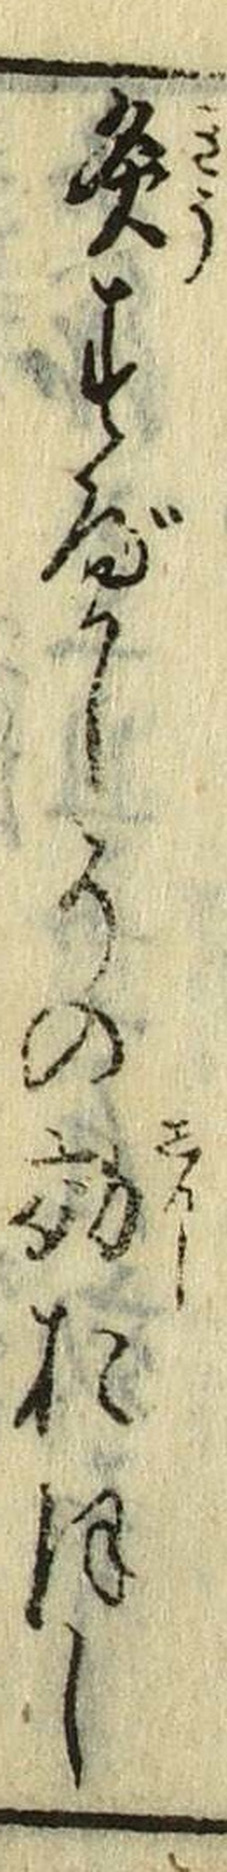灸すべしその效おほし
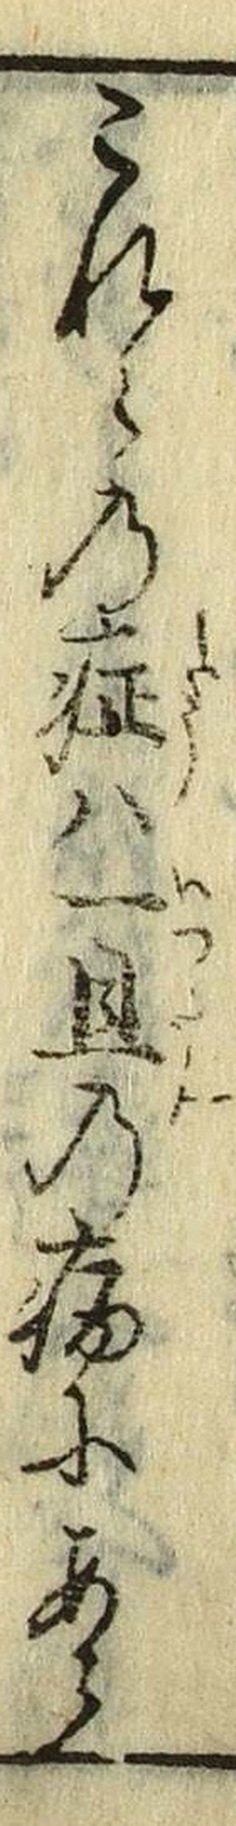これらの症は一旦の病にあら
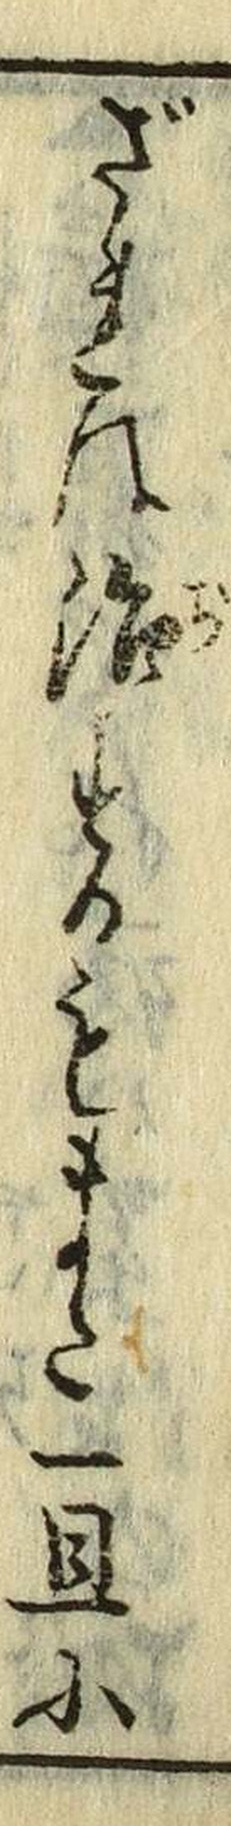ざれは治するもまた一旦に
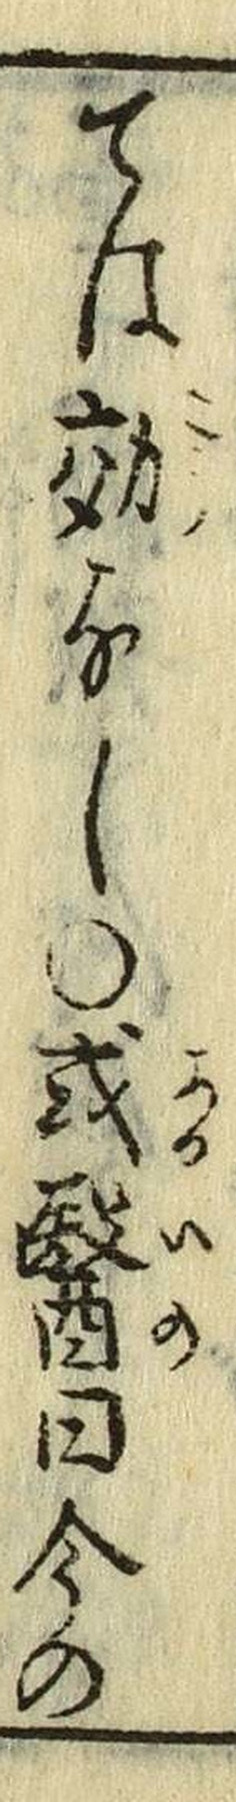ては効なし○或医曰今の
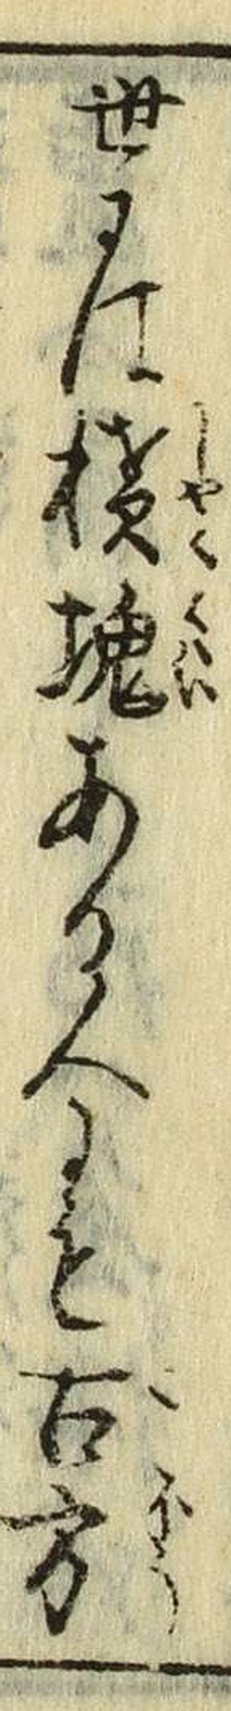世には積塊ある人にも古方
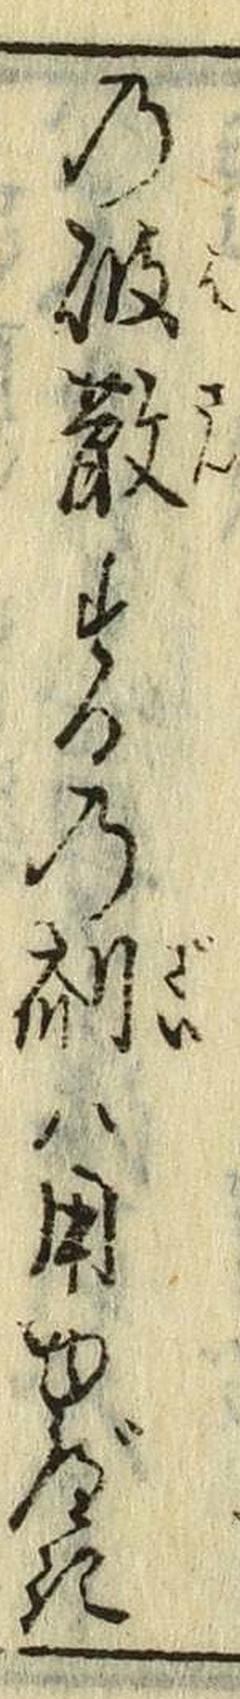の破散するの剤は用ゆべき
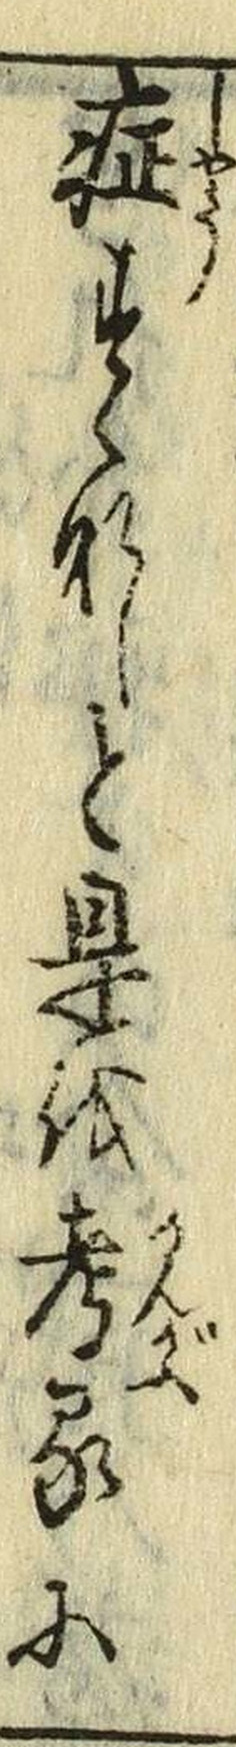症すくなしと是を考るに
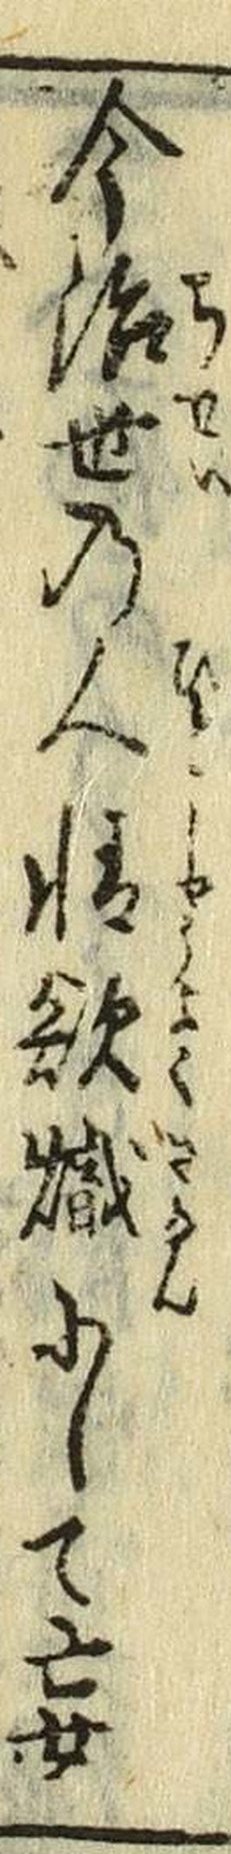今治世の人情欲熾にして妄
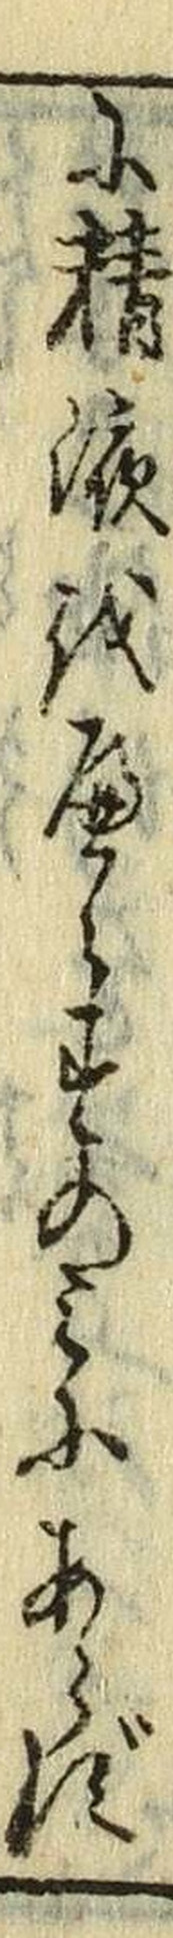に精液をへらすのみにあらず
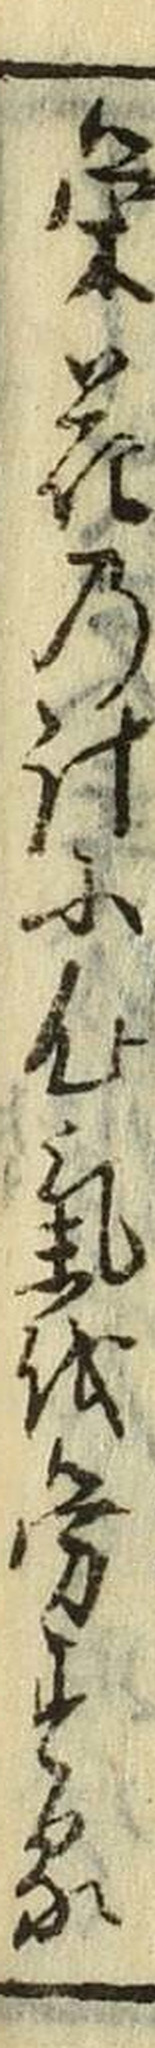栄花の計に心気を労する
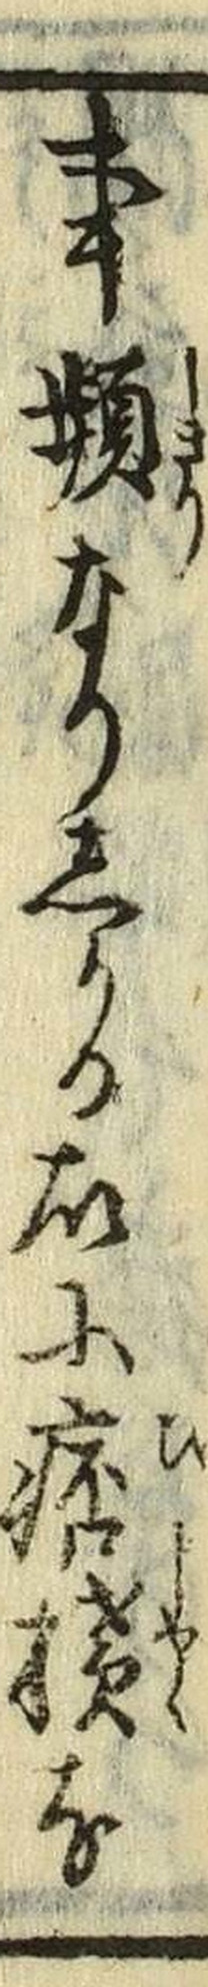事頻なりしかる故に痞積な
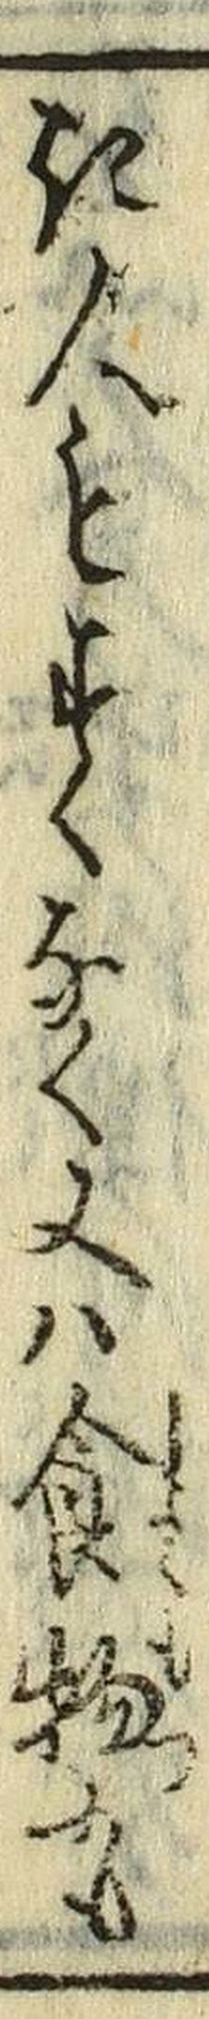き人もすくなく又は食物にも
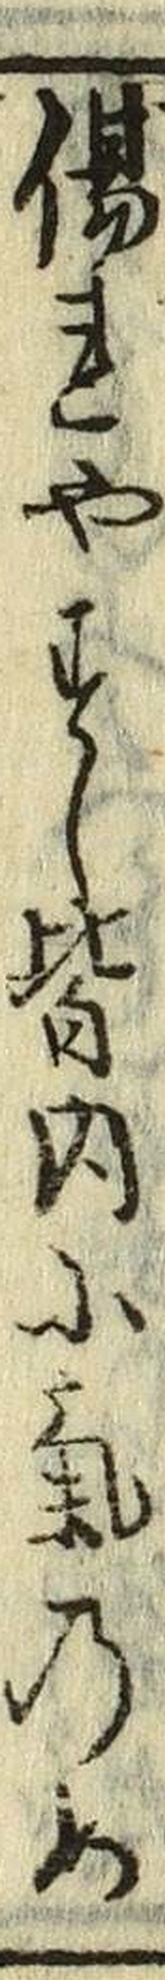傷れやすし皆内に気のめ
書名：居家養生記
